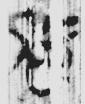者
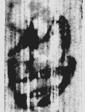皆
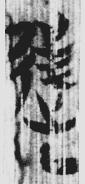逆
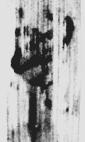民
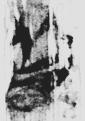皆
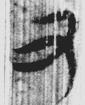又（有）
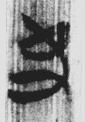夬
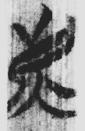麃
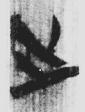之
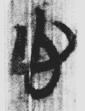心
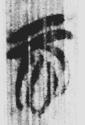而
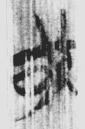或（國）
